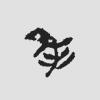{胃刀}
